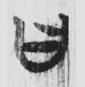曰
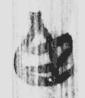臣
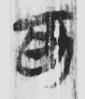为
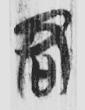君
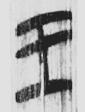王
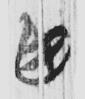臣
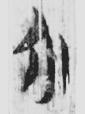介
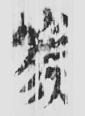备
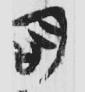名
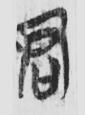君
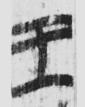王
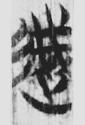○（践）
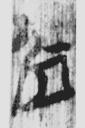凥（处）
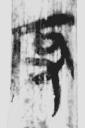辱
